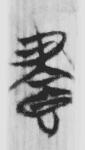{聿食}
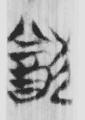猶
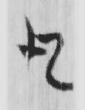卜
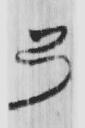乃
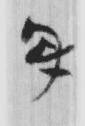身
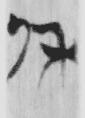休
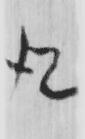卜
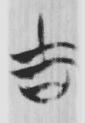吉
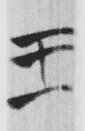王
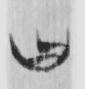曰
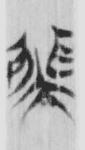{聑大}
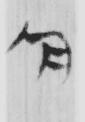今
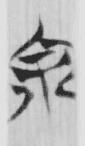余
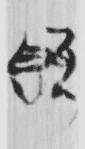既
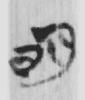明
